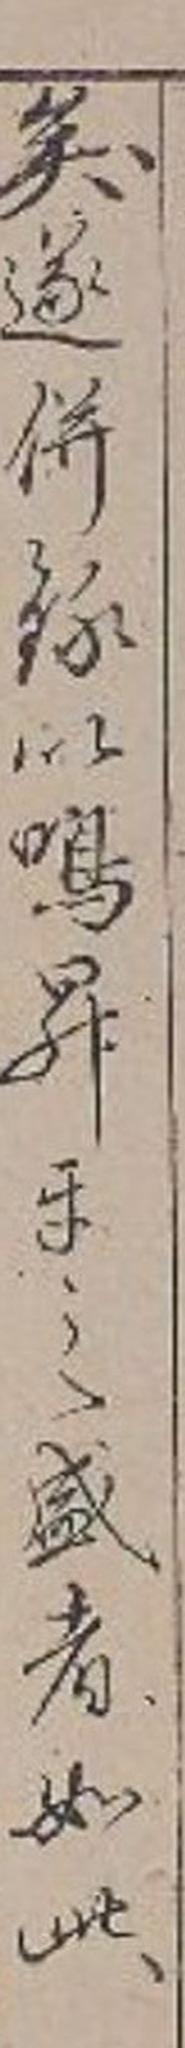矣、遂併録以鳴昇平之盛者如此、
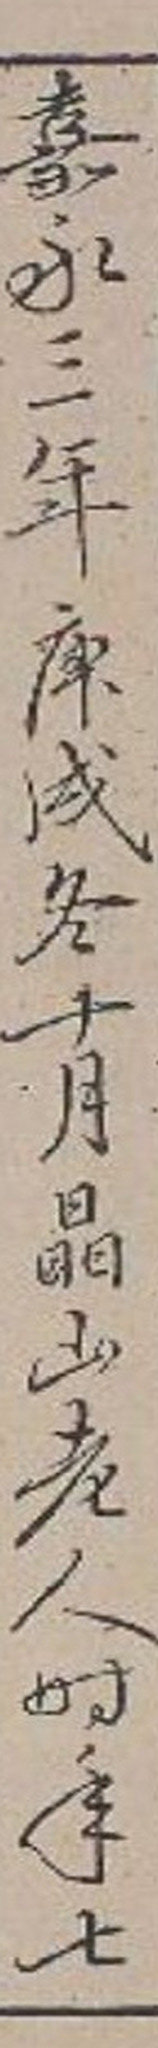嘉永三年庚戌冬十月晶山老人時年七
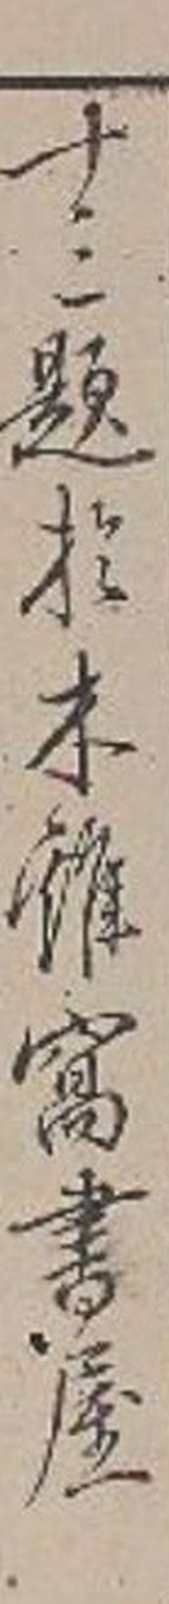十三題於木雞窩書屋
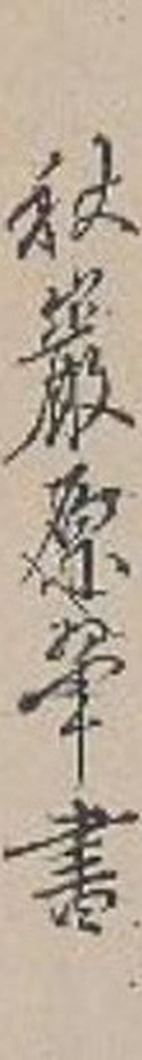秋巌原翬書
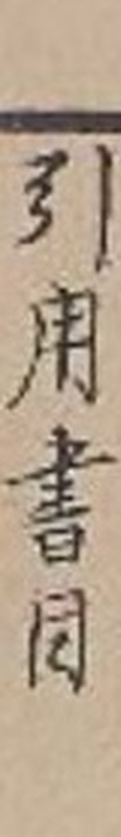引用書目
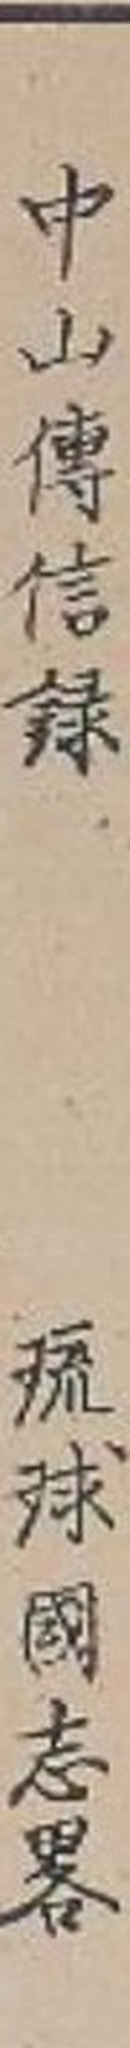中山伝信録琉球国志略
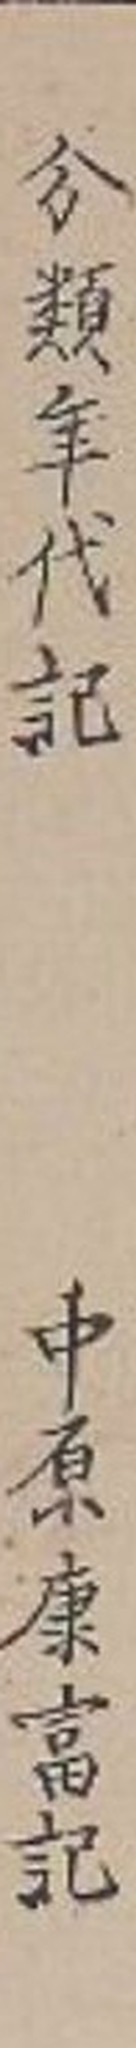分類年代記中原康富記
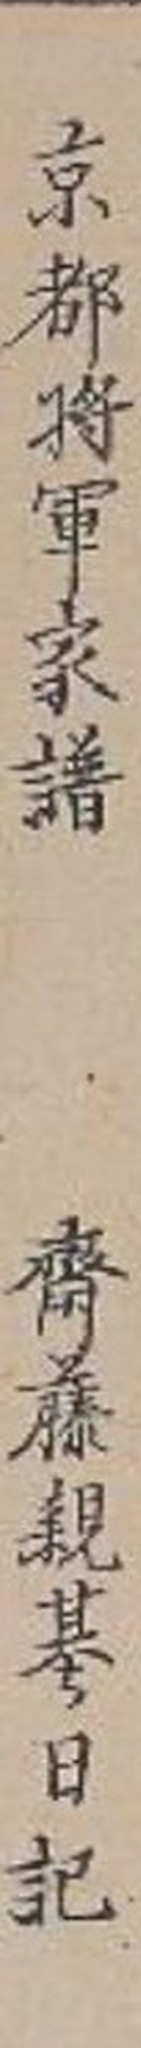京都将軍家譜斉藤親基日記
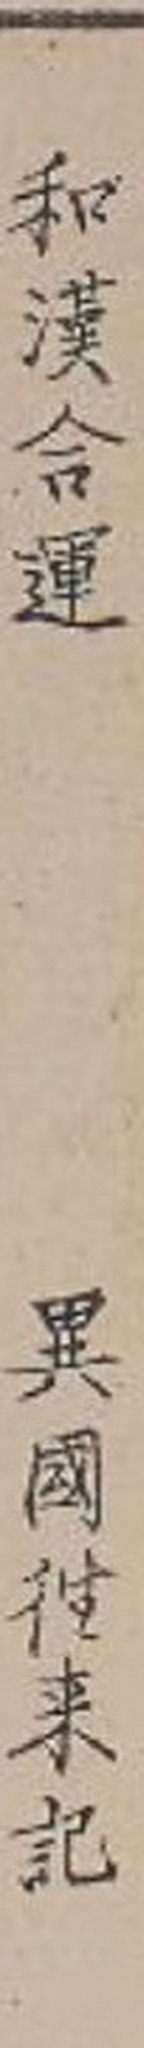和漢合運異国往来記
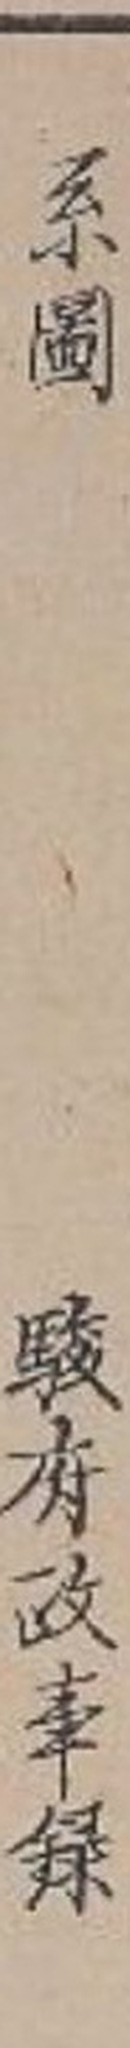系図駿府政事録

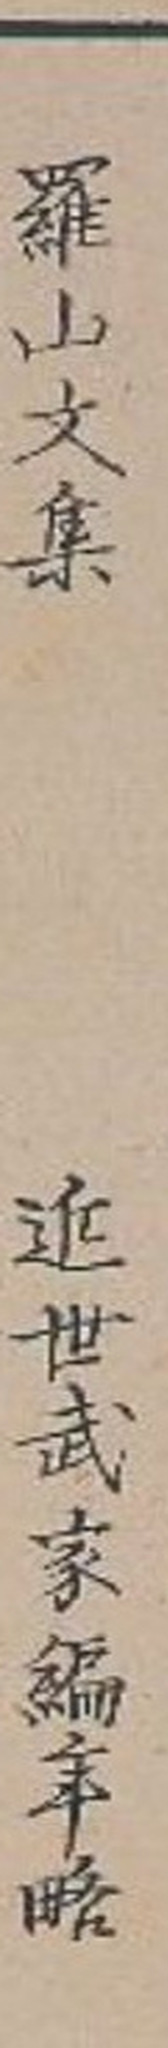羅山文集近世武家編年略
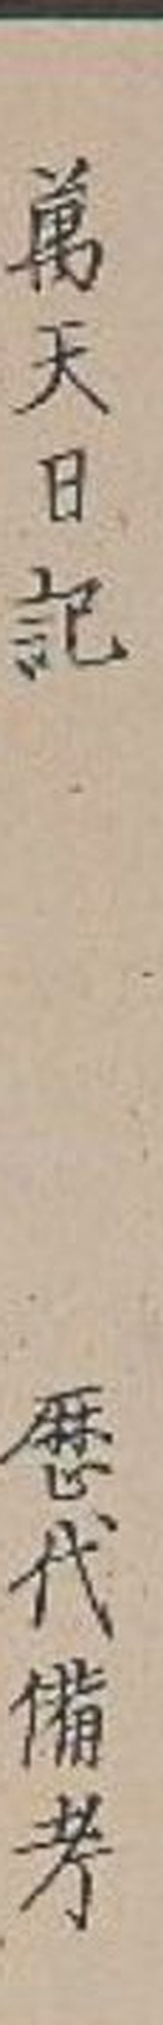万天日記暦代備考
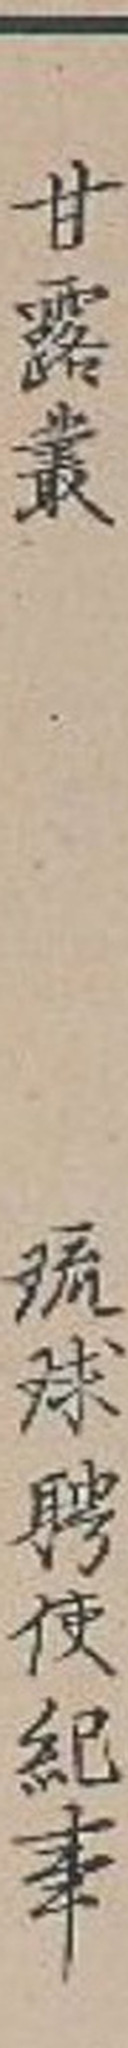甘露叢琉球聘使紀事
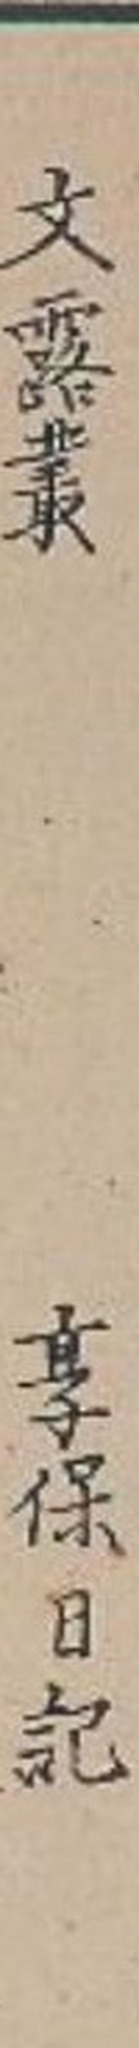文露叢享保日記
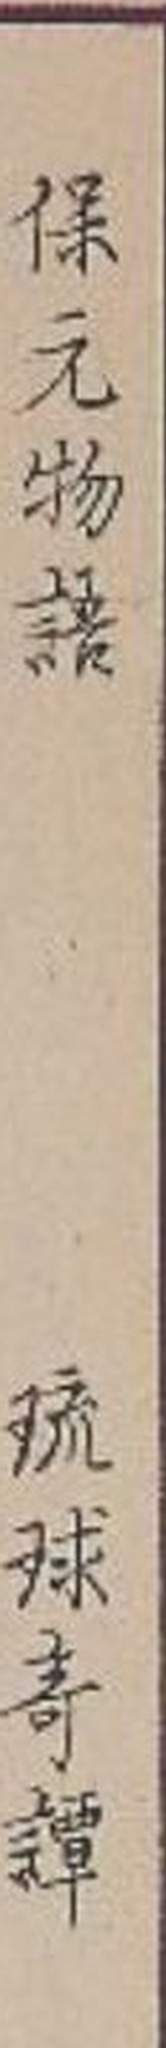保元物語琉球奇譚
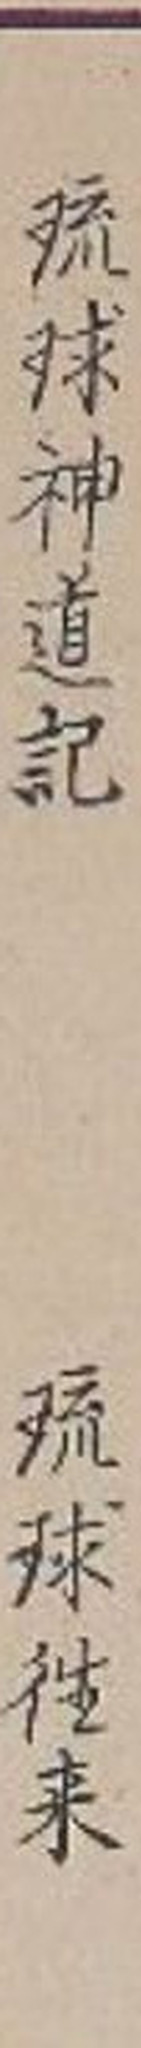琉球神道記琉球往来
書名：琉球入貢紀略
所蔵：University of the Ryukyus Library
